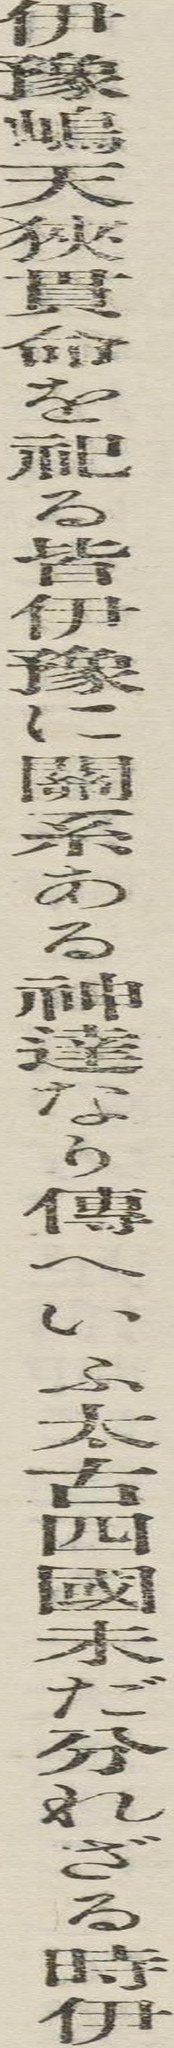伊予島天狭貫命を祀る皆伊予に関係ある神達なり伝へいふ太古四国未だ分れざる時伊
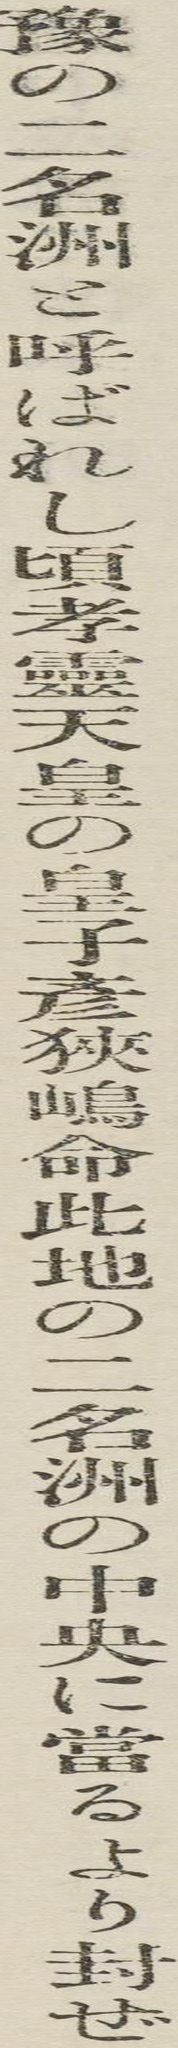予の二名洲と呼ばれし頃孝霊天皇の皇子彦狭島命此地の二名洲の中央に当るより封ぜ
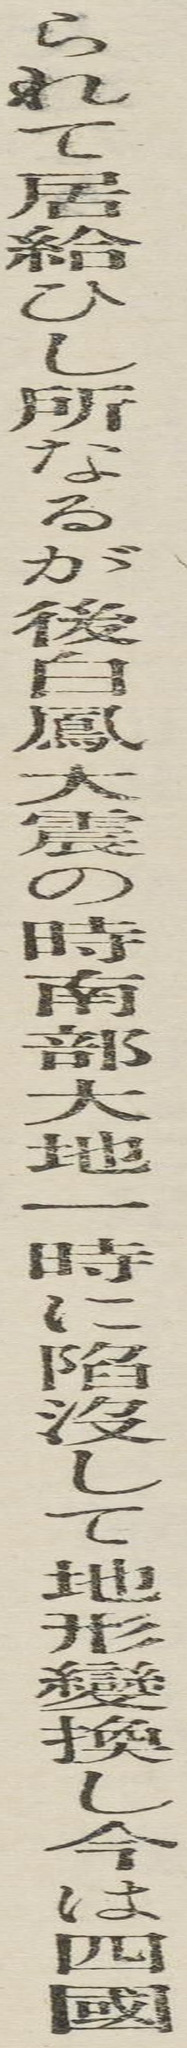られて居給ひし所なるが後白鳳大震の時南部大地一時に陥没して地形変換し今は四国
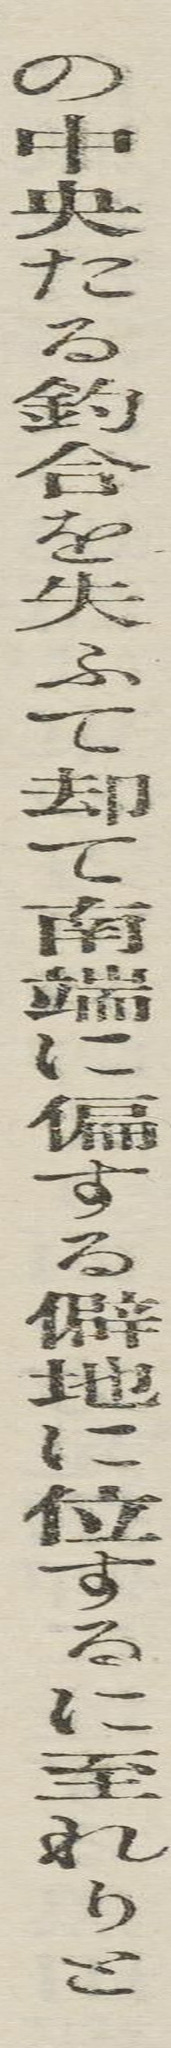の中央たる釣合を失ふて却て南端に偏する僻地に位するに至れりと
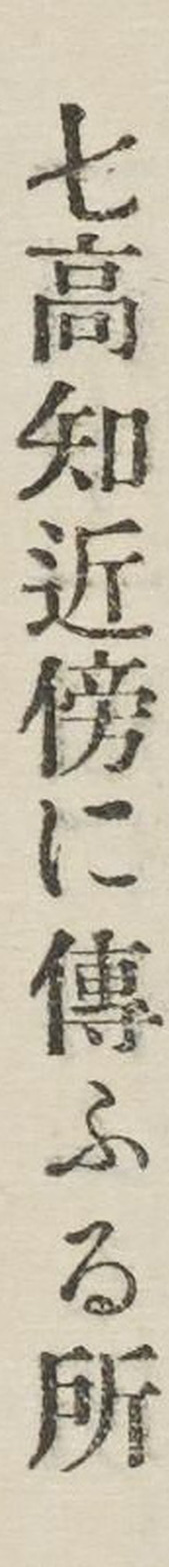㈦高知近傍に伝ふる所
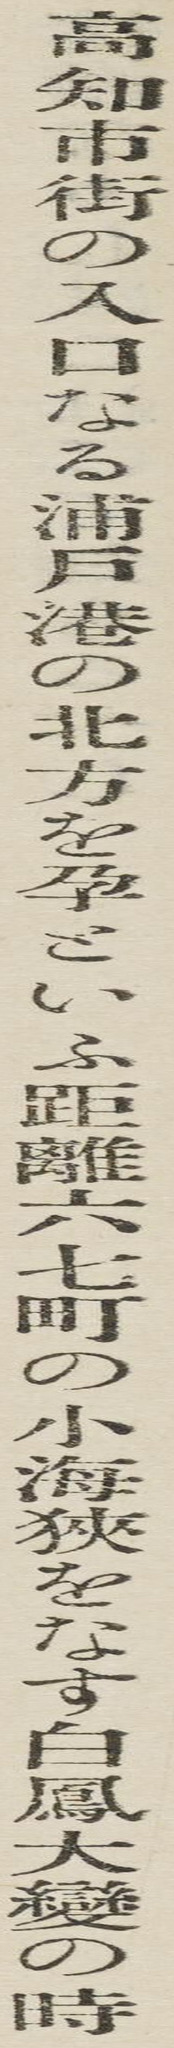高知市街の入口なる浦戸港の北方を孕といふ距離六七町の小海峡をなす白鳳大変の時
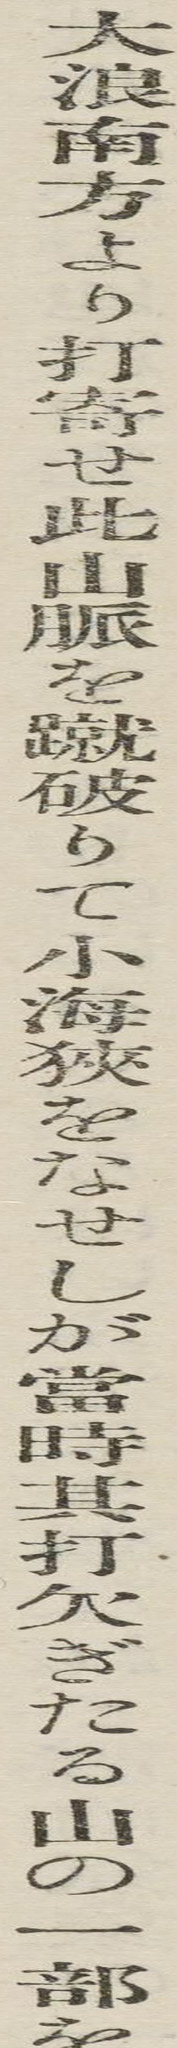大浪南方より打寄せ此山脈を蹴破りて小海峡をなせしが当時其打欠ぎたる山の一部を
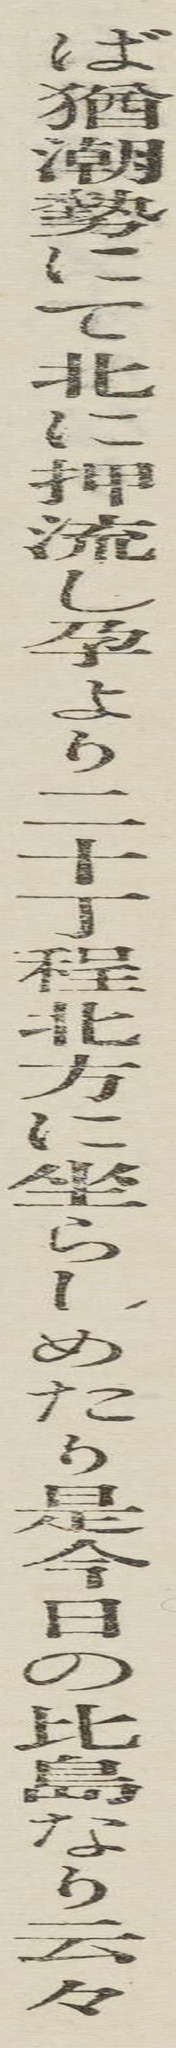ば猶潮勢にて北に押流し孕より二十丁程北方に坐らしめたり是今日の此島なり云々
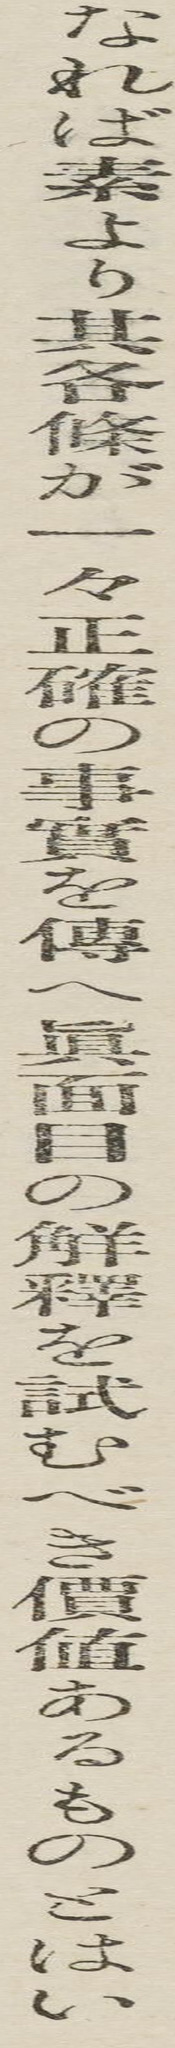なれば素より其各条が一々正確の事実を伝へ真面目の鮮釈を試むべき価値あるものとはい
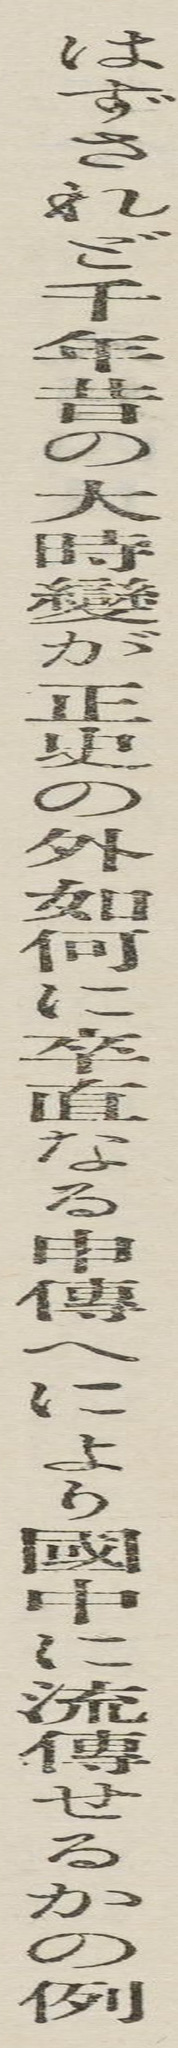はずされど千年昔の大時変が正史の外如何に卒直なる申伝へにより国中に流伝せるかの例
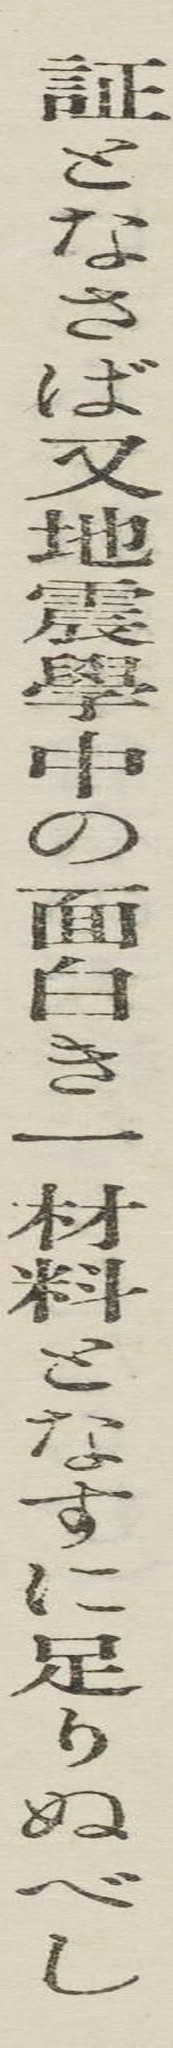証となさば又地震学中の面白き一材料となすに足りぬべし
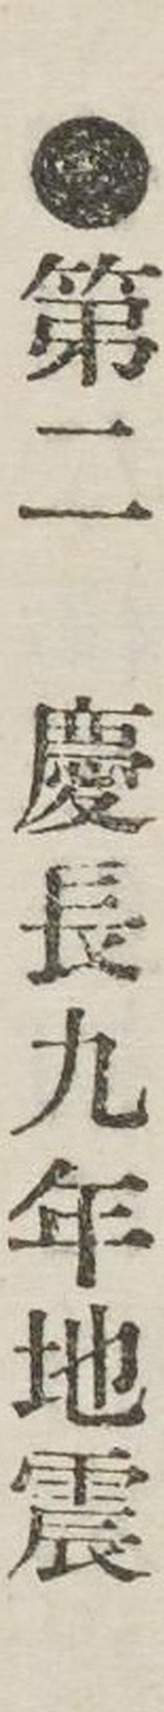●第二慶長九年地震
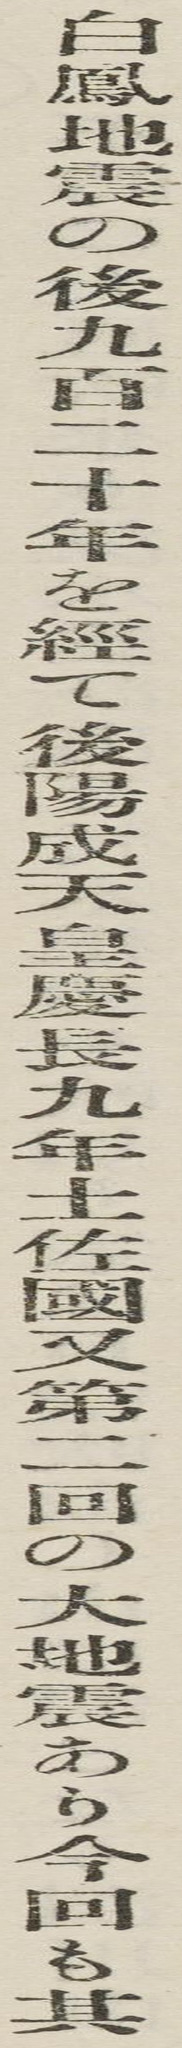白鳳地震の後九百二十年を経て後陽成天皇慶長九年土佐国又第二回の大地震あり今回も其
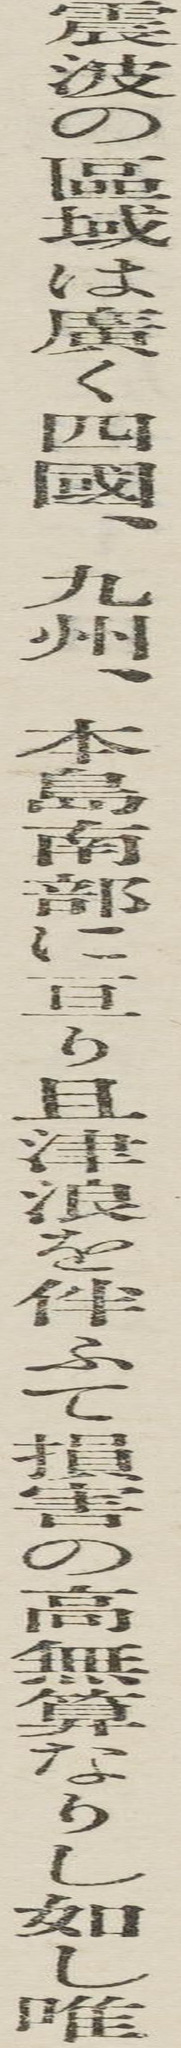震波の区域は広く四国、九州、本島南部に亘り且津浪を伴ふて損害の高無算なりし如し唯
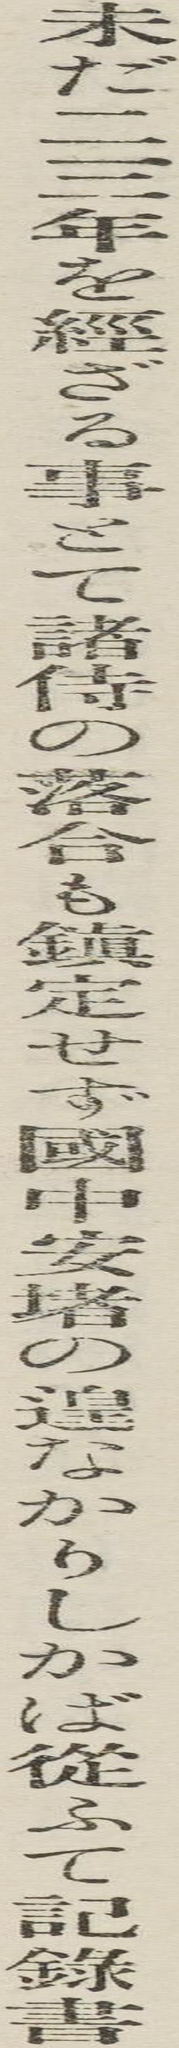未だ二三年を経ざる事とて諸侍の落合も鎮定せず国中安堵の遑なかりしかば従ふて記録書
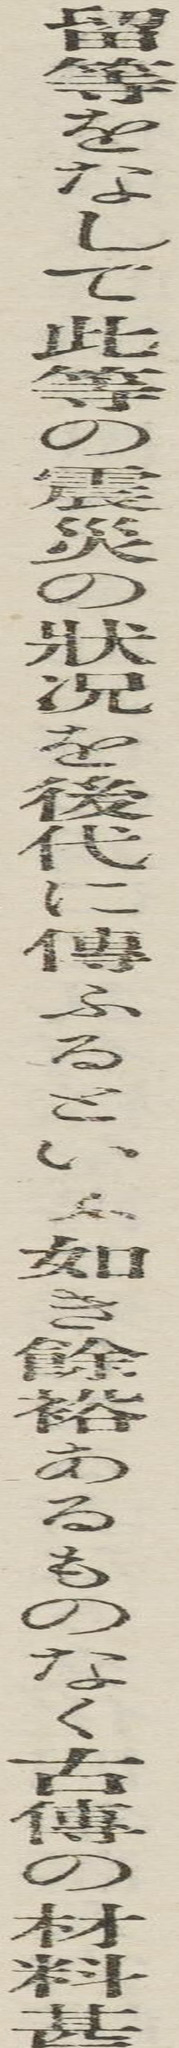留等をなして此等の震災の状況を後代に伝ふるといふ如き余裕あるものなく古伝の材料甚
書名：土佐古今ノ地震
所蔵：東京大学地震研究所図書室 Earthquake Research Institute Library, The University of Tokyo, JAPAN
